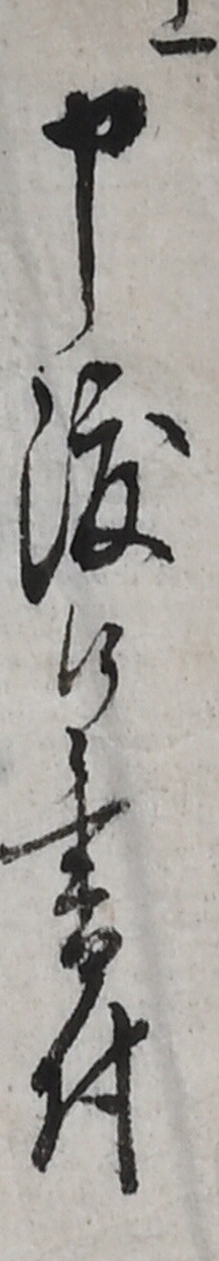申渡候書付
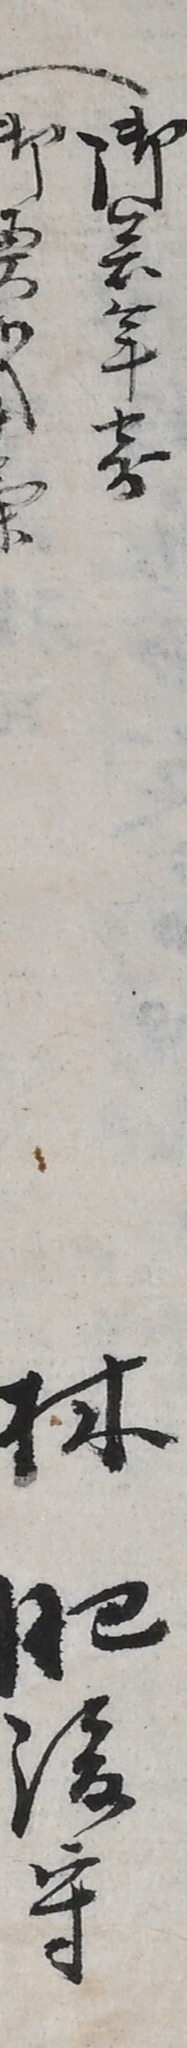御表年寄林肥後守
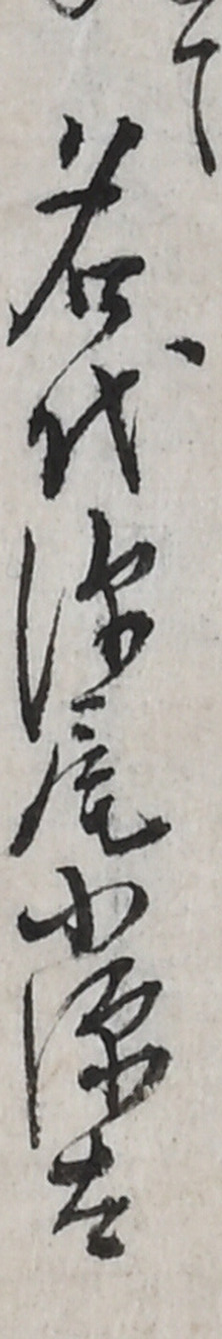〇名代深尾小源太
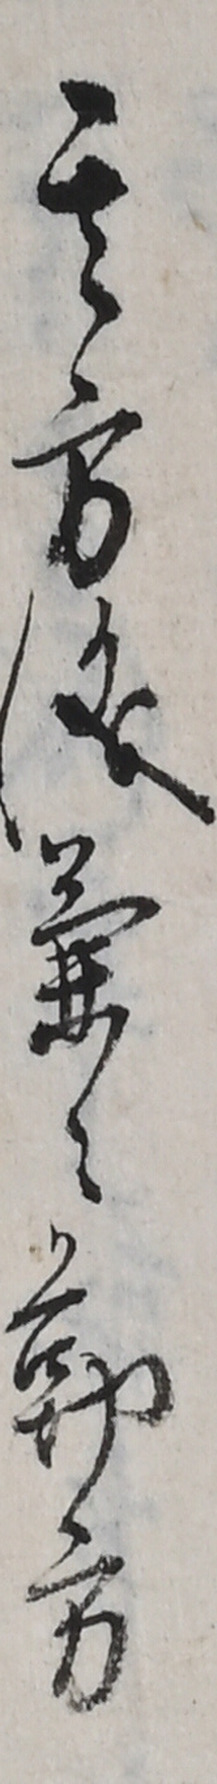其方儀兼々勤方
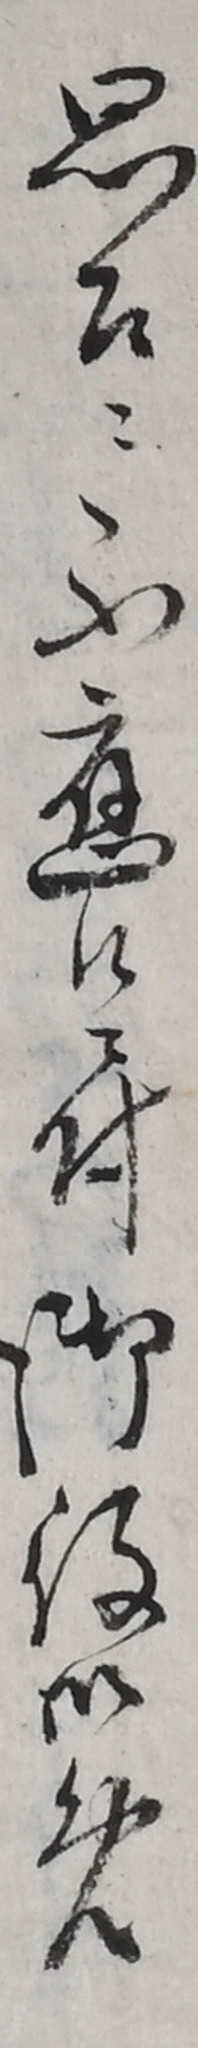思召ニ不応候ニ付御役御免
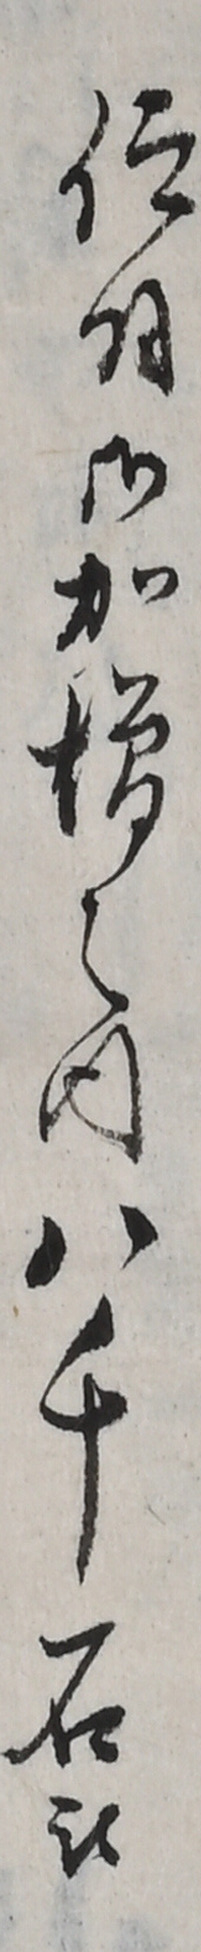仰付御加増之内八千石被
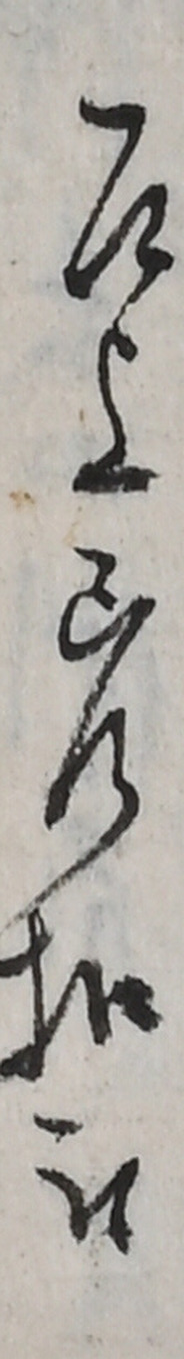召上差控被
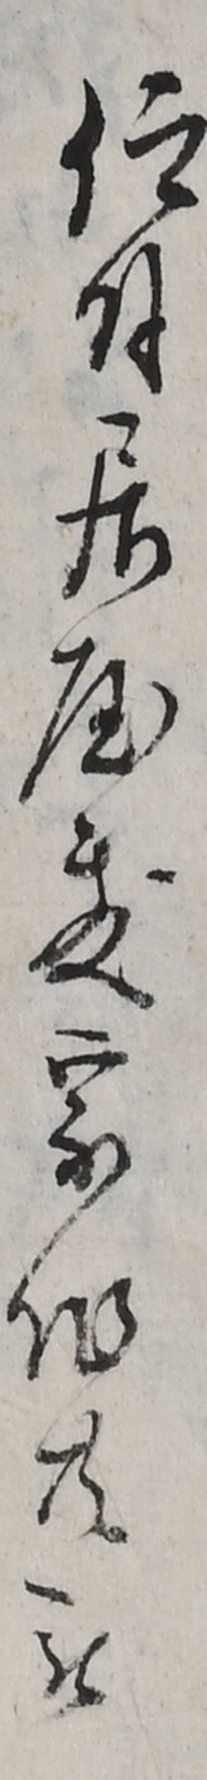仰付居屋敷家作共被
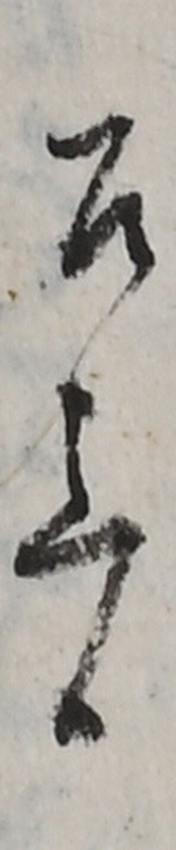召上候

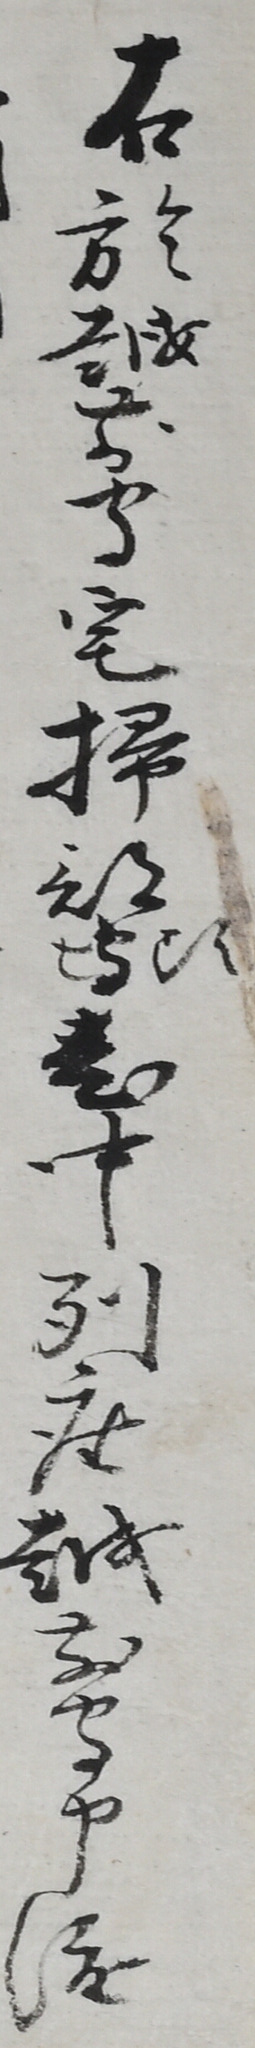右於越前守宅掃部守老中列座越前守申渡
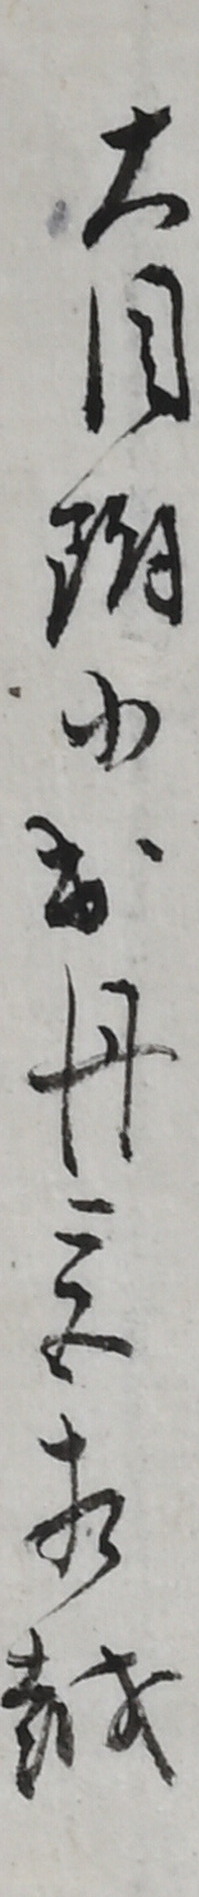大目附小出丹宮相越
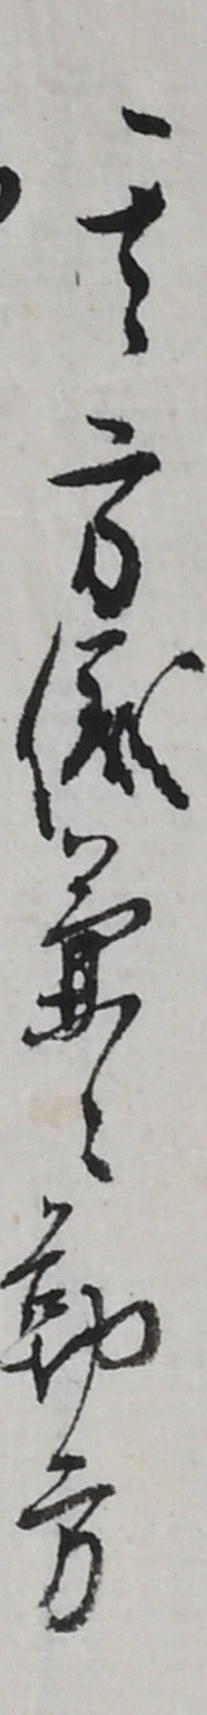其方儀兼々勤方
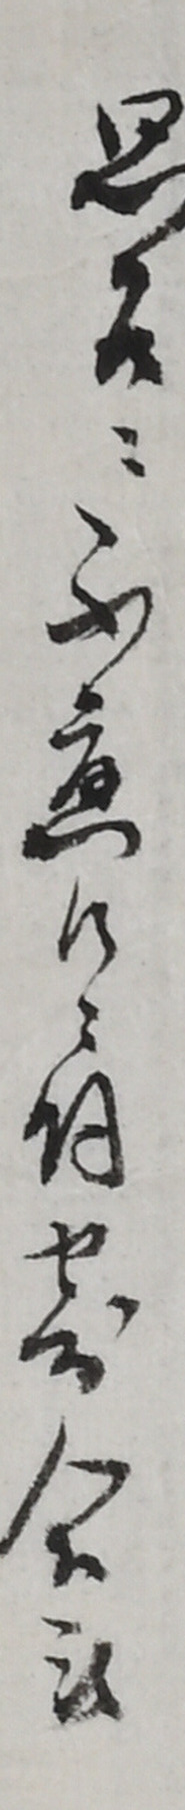思召ニ不応候ニ付寄合被
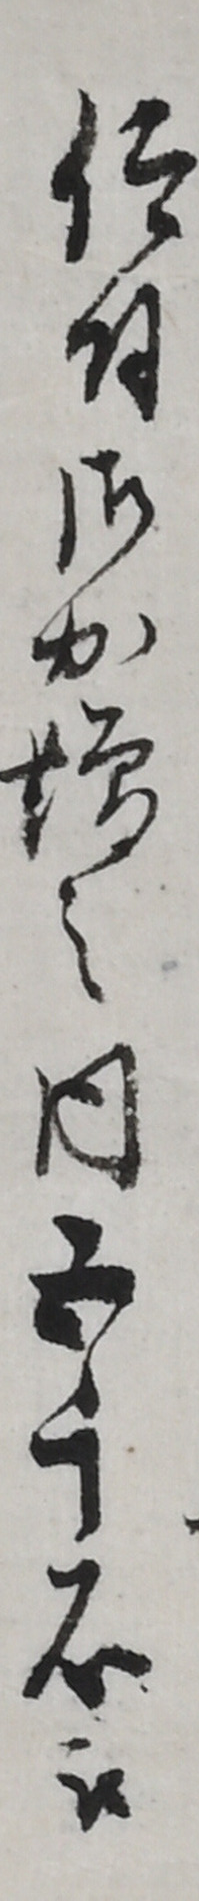仰付御加増之内五千石被
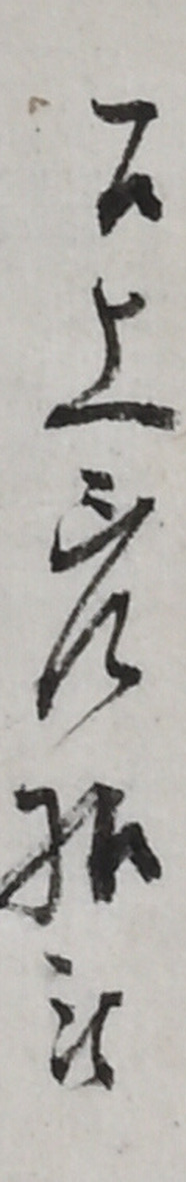召上差控被
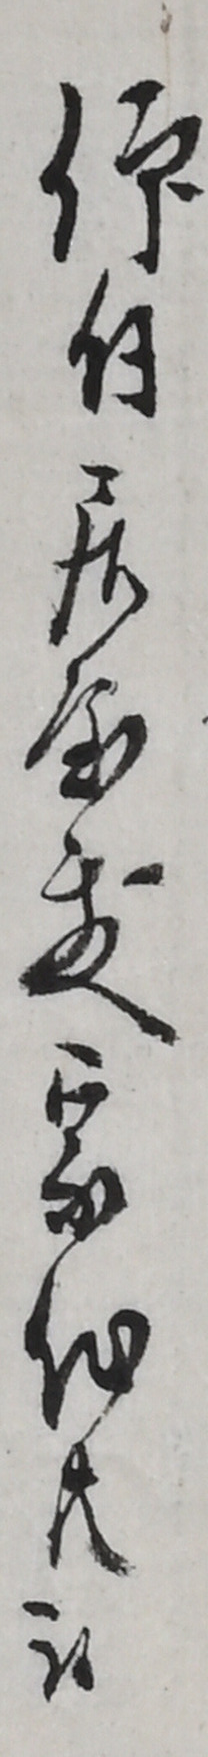仰付居屋敷家作共被
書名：申渡候書付
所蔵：伊那市立高遠町図書館・合同会社AMANE
